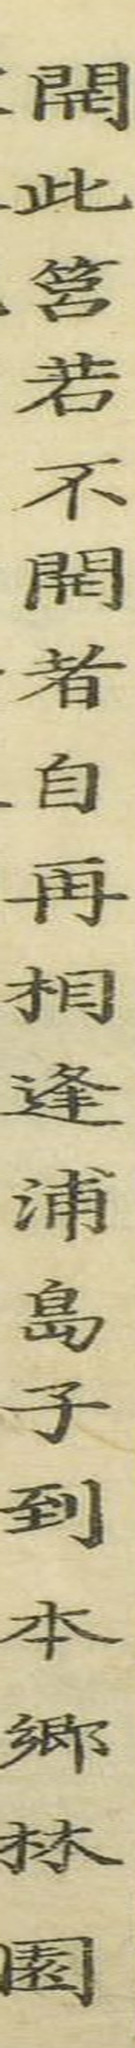開此筥若不開者自再相逢浦島子到本郷林園
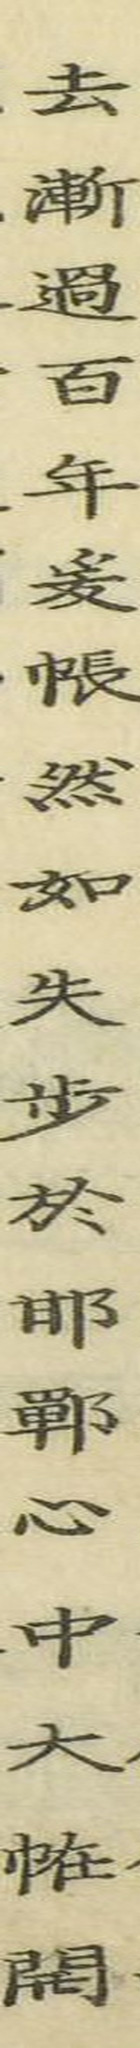去漸過百年爰帳然如失歩於邯鄲心中大開
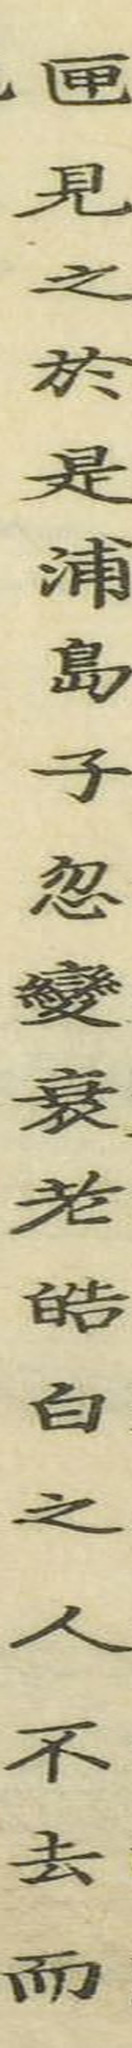匣見之於是浦島子忽變衰老晧白之人不去而
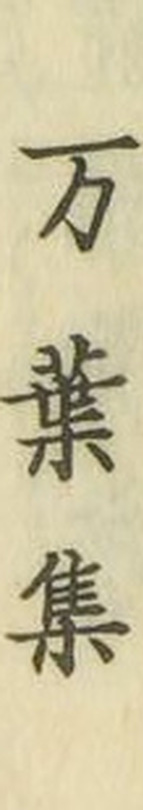万葉集
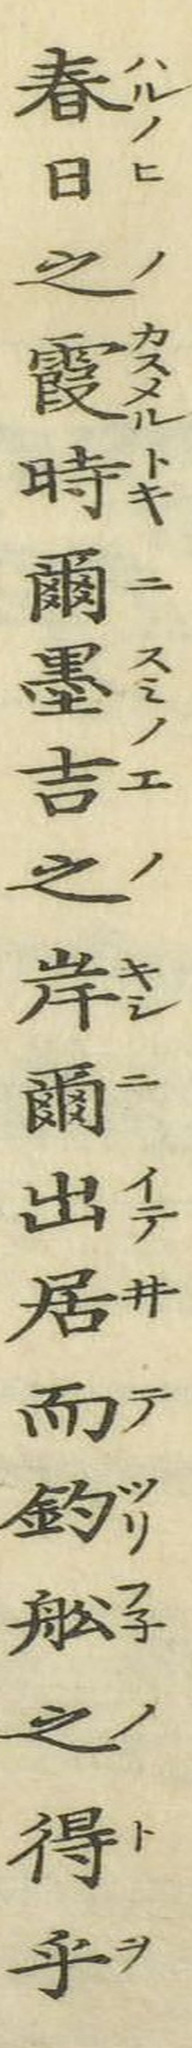春日之霞時爾墨吉之岸爾出居而釣舩之得乎
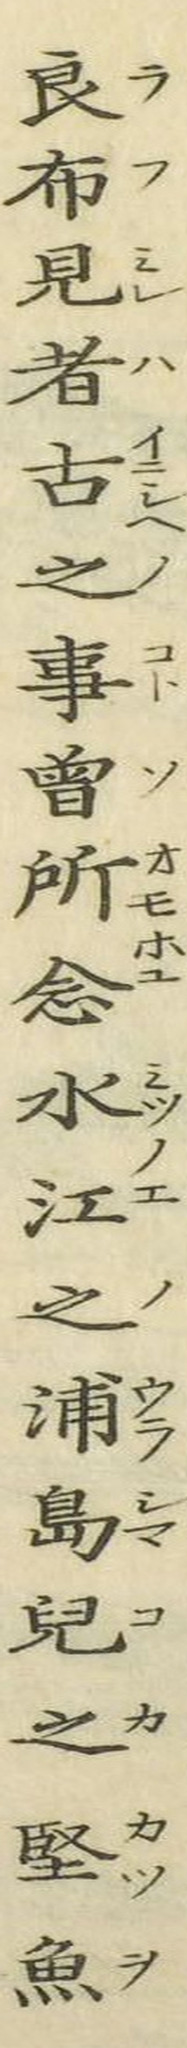良布見者古之事曽所念水江之浦島兒之堅魚
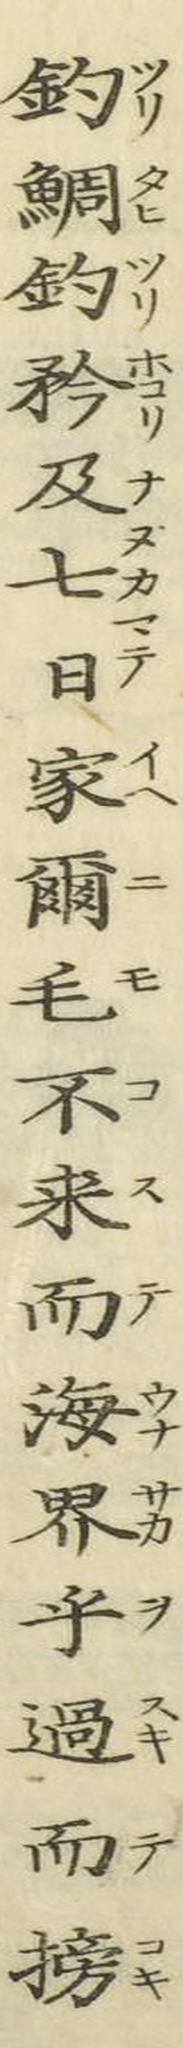釣鯛釣矜及七日家爾毛不来而海界乎過而搒
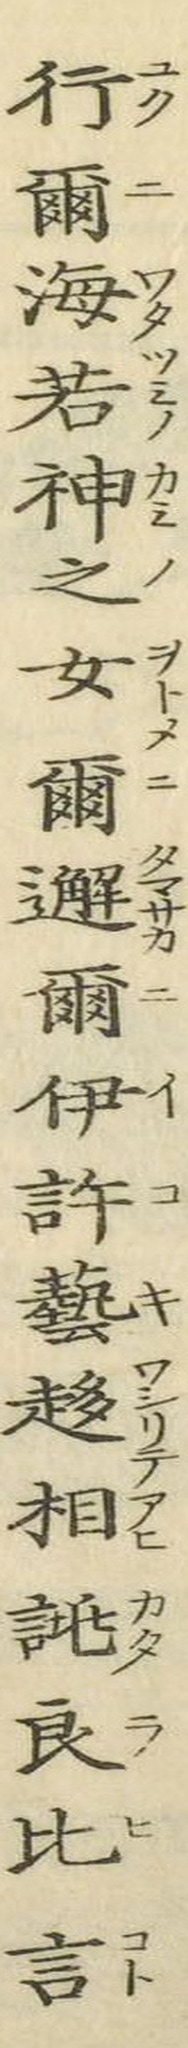行爾海若神之女爾邂爾伊許藝趍相𧨙良比言
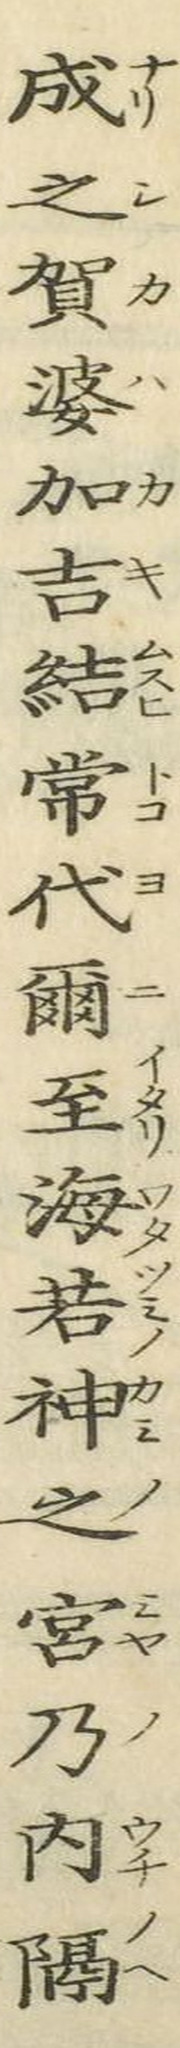成之賀婆加吉結常代爾至海若神之宮乃内隔
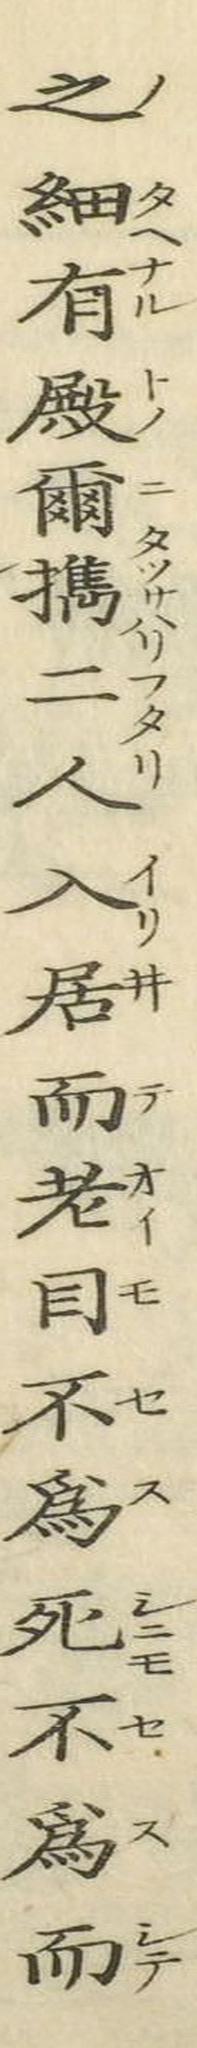之細有殿爾擕二人入居而老目不為死不為而
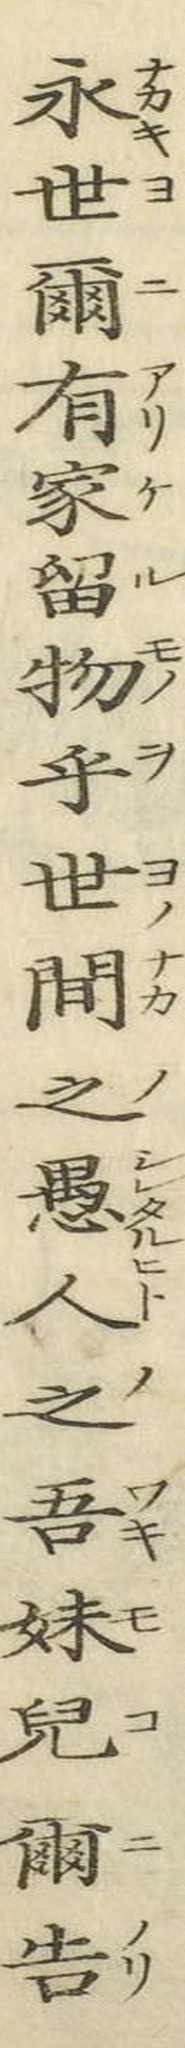永世爾有家留物乎世間之愚人之吾妹兒爾告
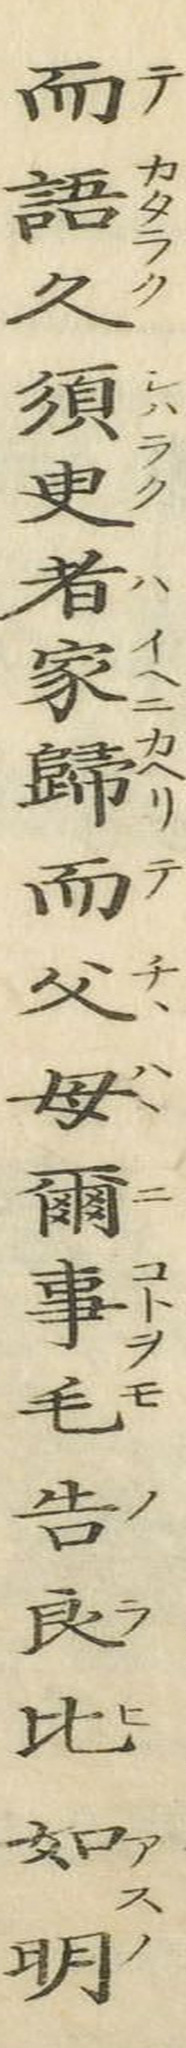而語久須臾者家歸而父母爾事毛告良比如明
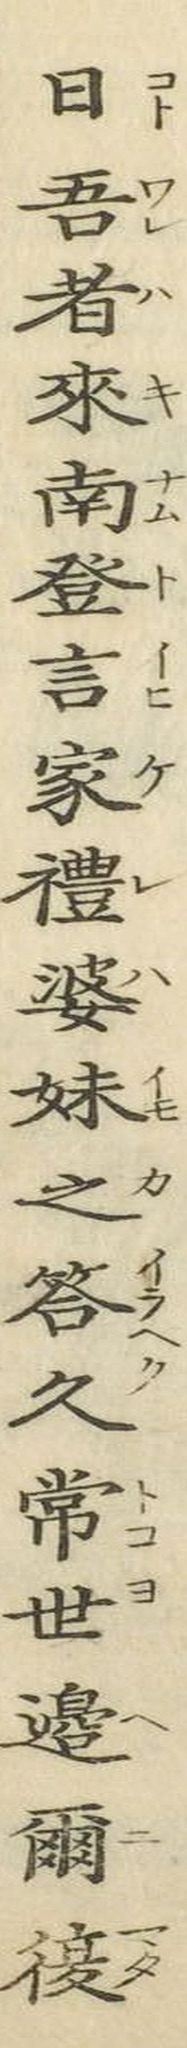日吾者來南登言家禮婆妹之答久常世邊爾復
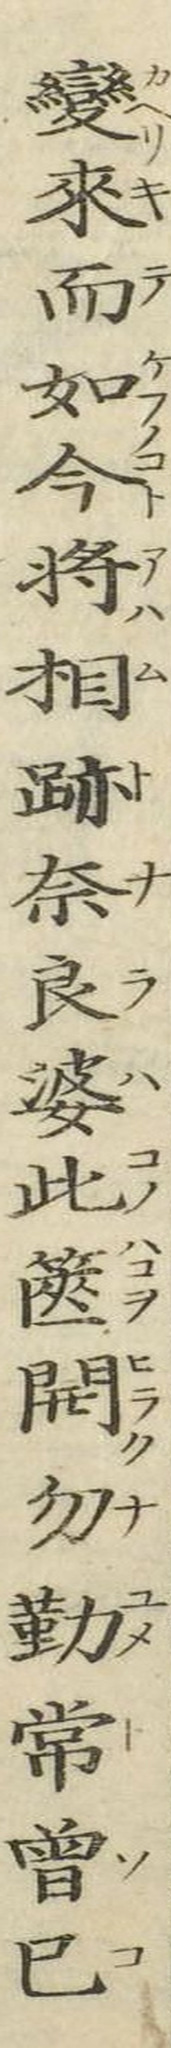變來而如今将相跡奈良婆此篋開勿勤常曽己
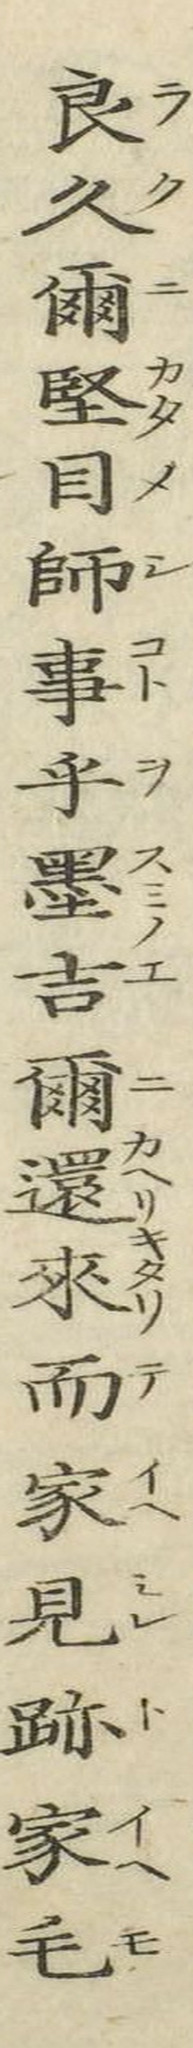良久爾堅目師事乎墨吉爾還來而家見跡家毛
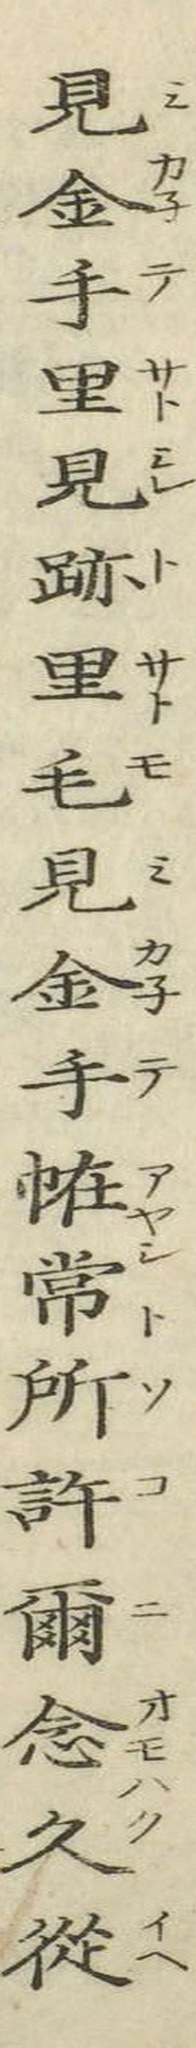見金手里見跡里毛見金手常所許爾念久從
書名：江戸名所図会 20巻 巻之5
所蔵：東京学芸大学教育コンテンツアーカイブ
